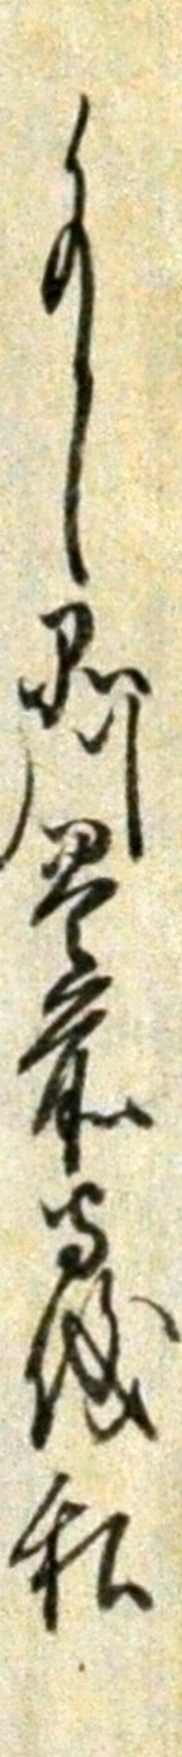尚々品川豊前守儀私
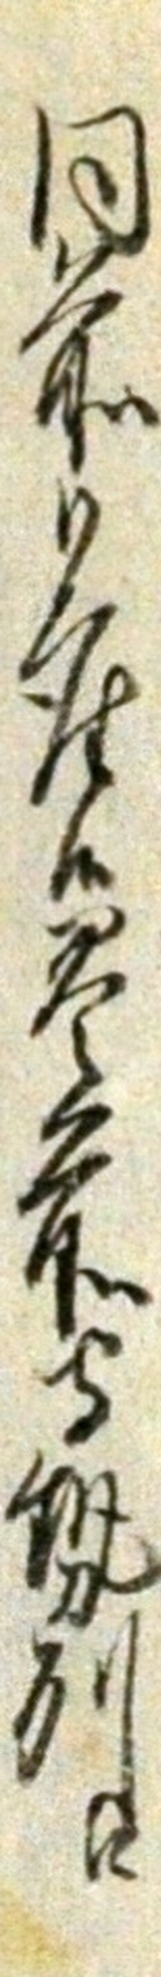同前御座候豊前守勢州江
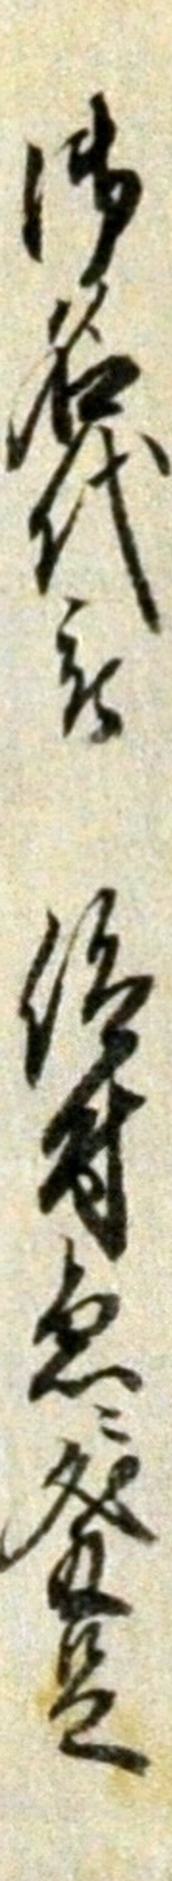御名代被仰付急ニ発足
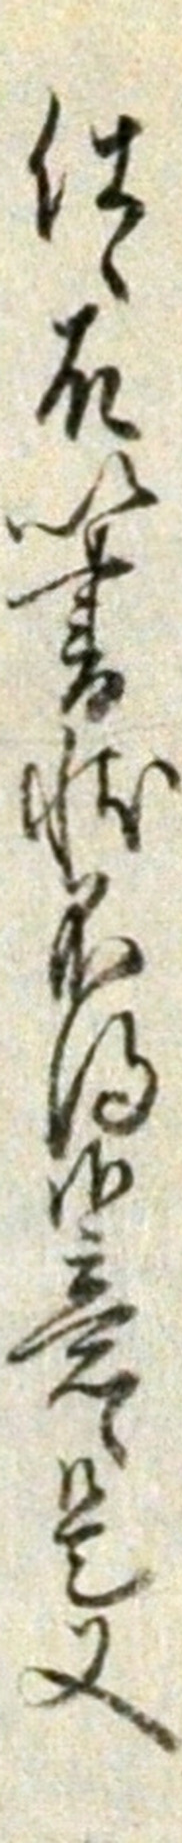仕候故以書状不得御意候是又
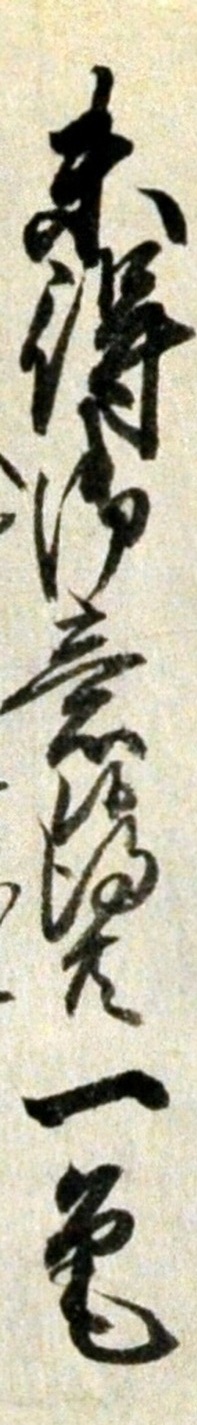未得御意候得共一筆
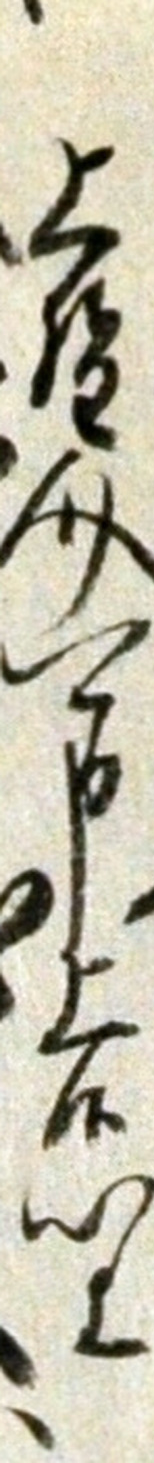上野介可申上候以上
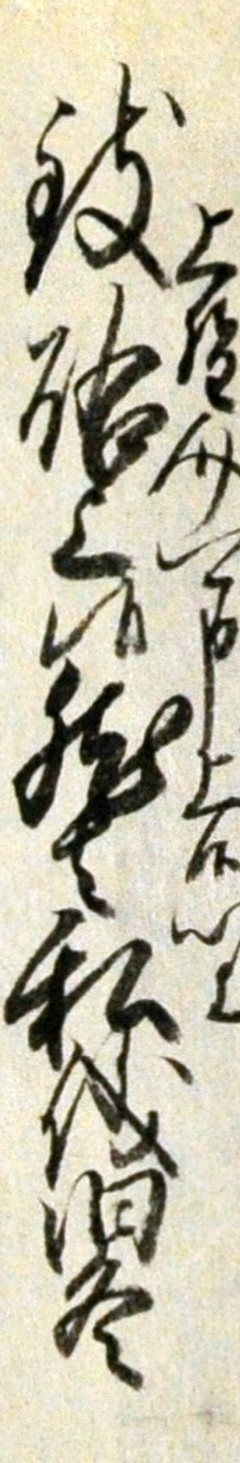致啓上候然者私儀旧冬
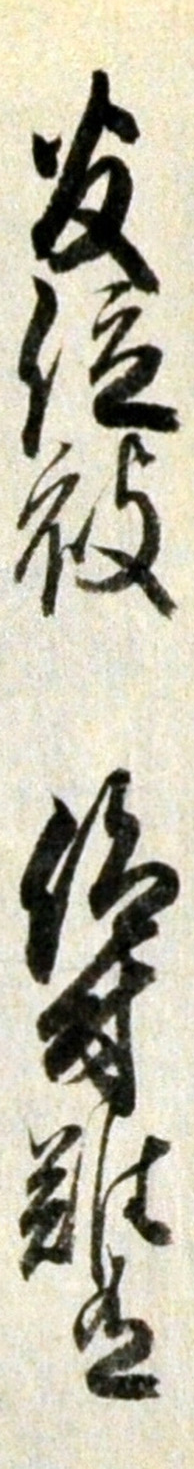官位被仰付難有
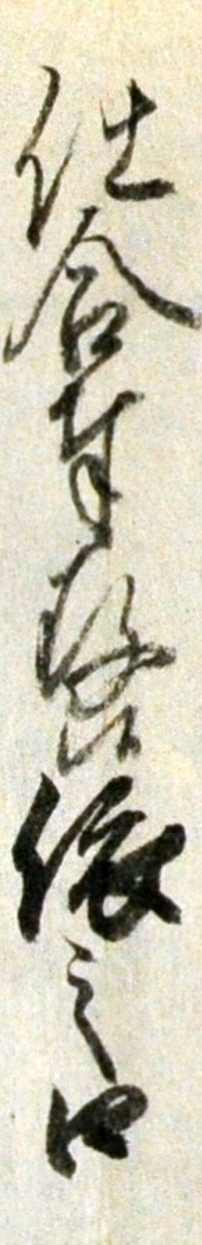仕合奉存候依之口
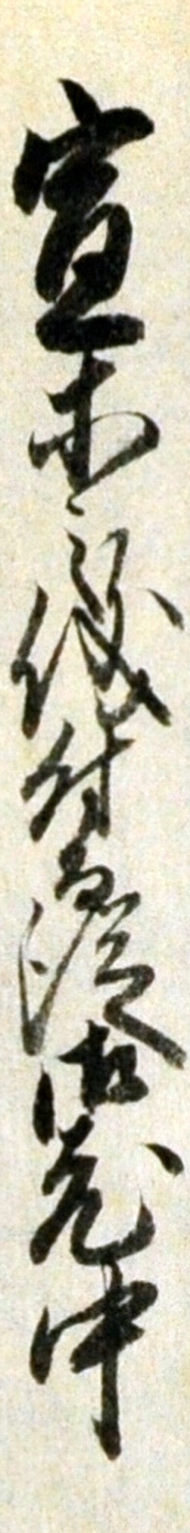宣等之儀付而従御老中
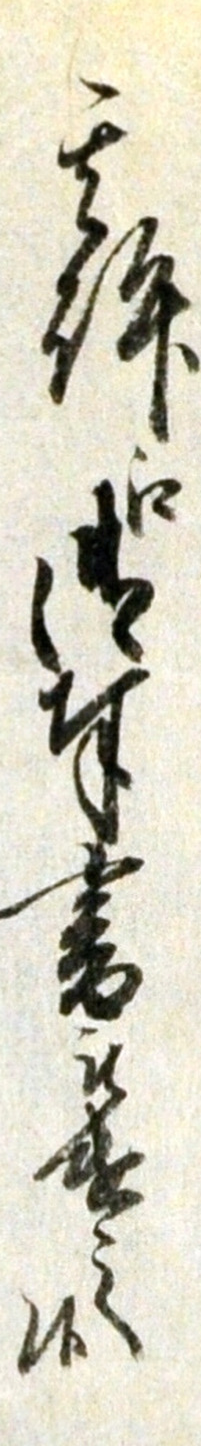其許江御奉書被遣之候
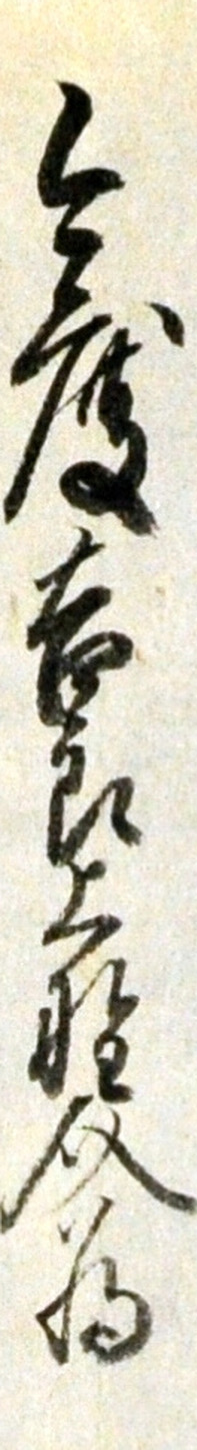今度吉良上野介為
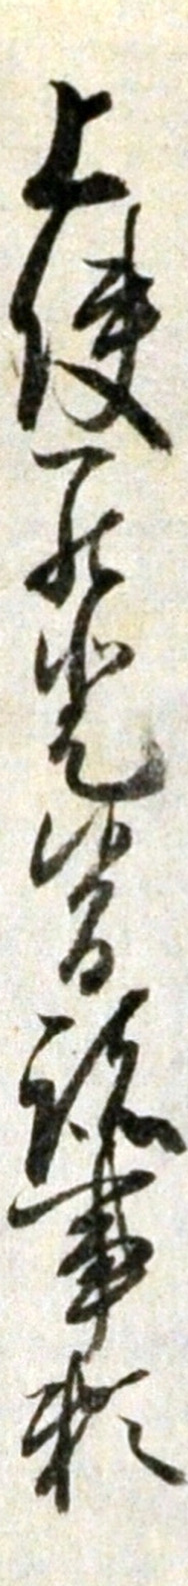上使罷登候間諸事頼
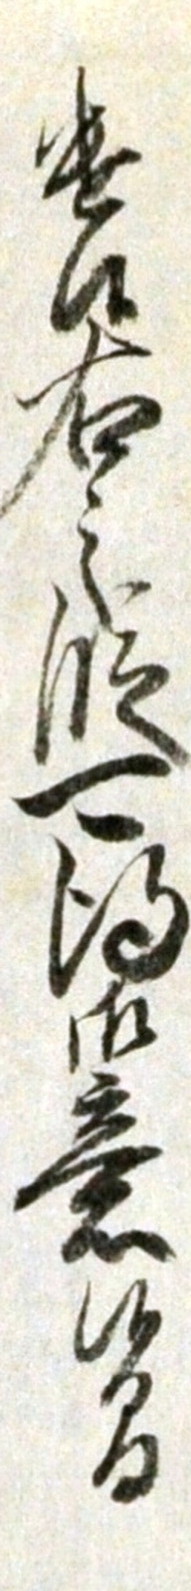遣候右之段可得御意候間
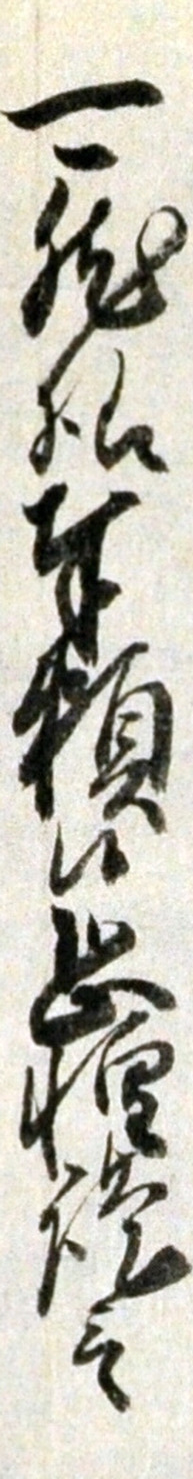可然様奉頼候恐惶謹言
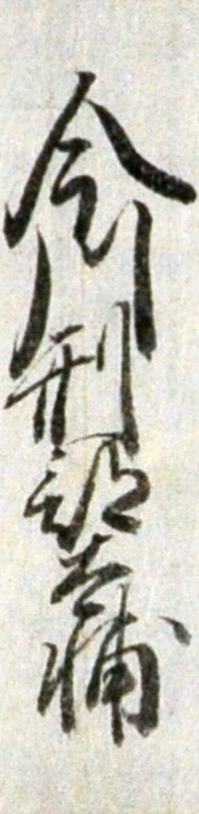今川刑部大輔
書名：書状
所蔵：伊那市立高遠町図書館・合同会社AMANE
